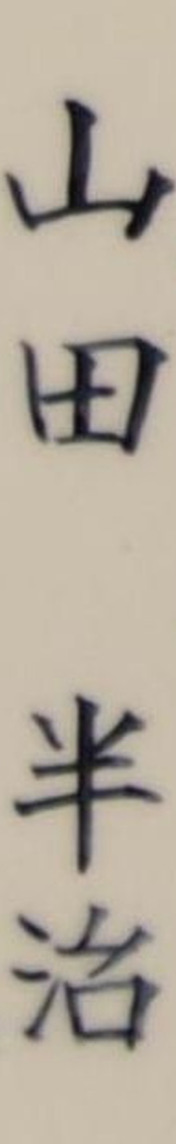山田半治
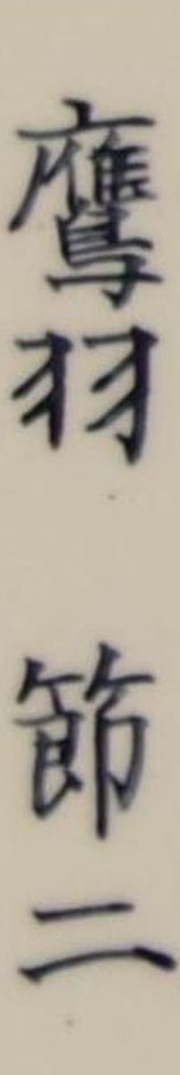鷹羽節二
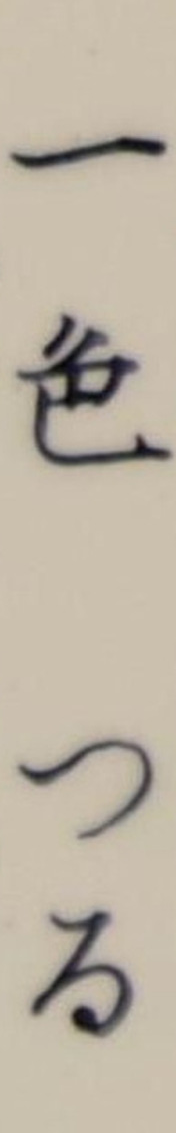一色つる
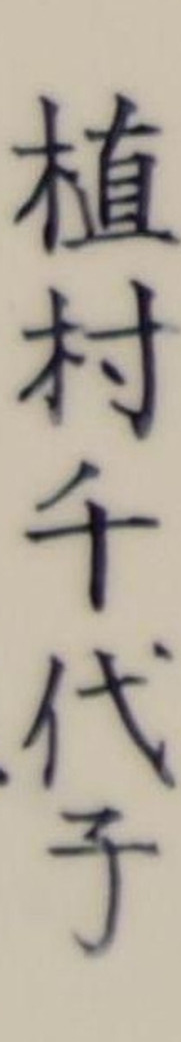植村千代子
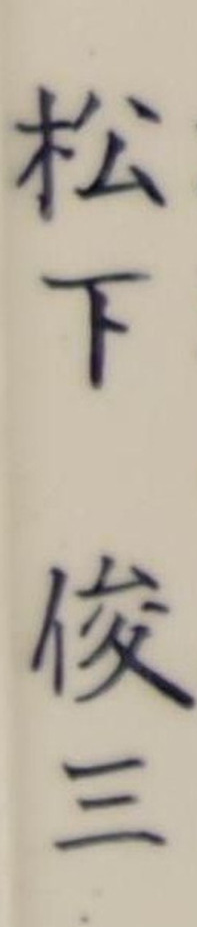松下俊三

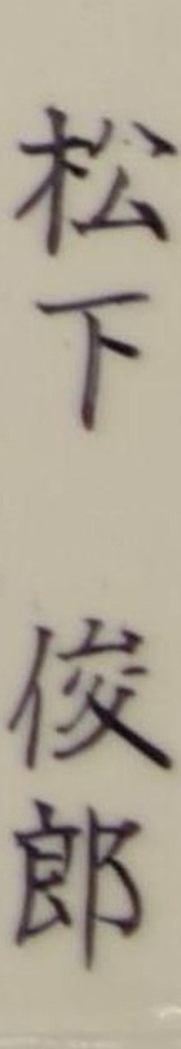松下俊朗
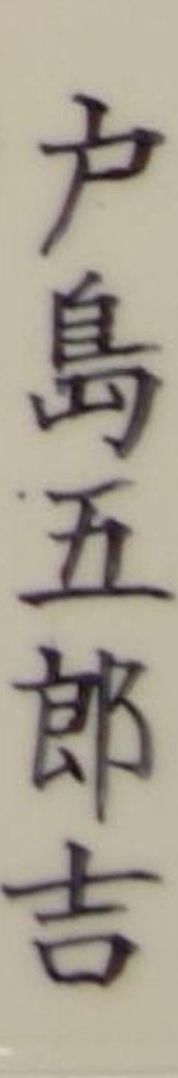戸島五郎吉
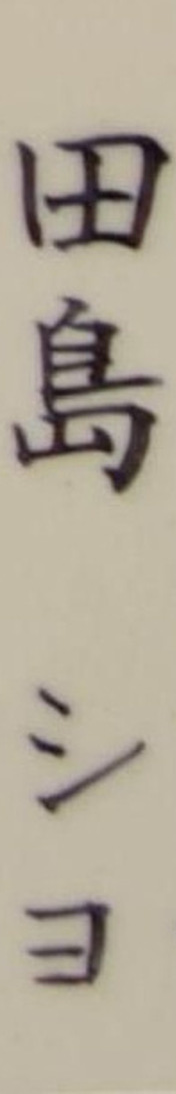田島シヨ
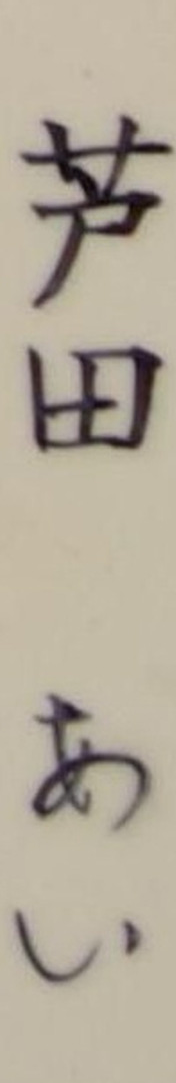芦田あい
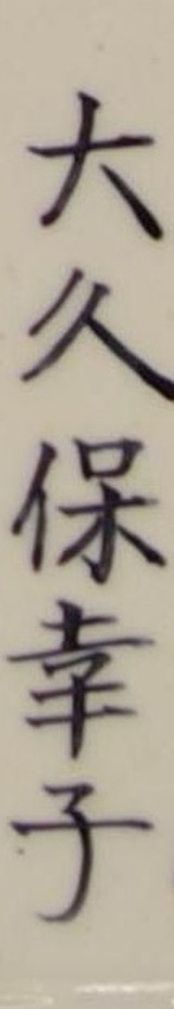大久保幸子
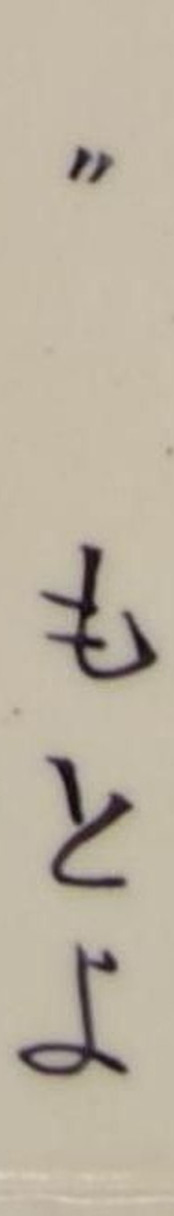もとよ
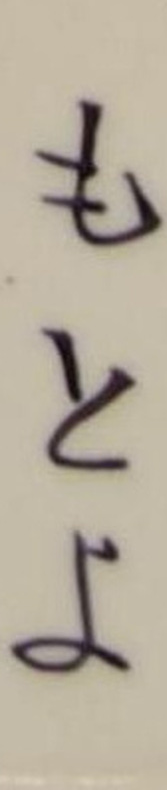もとよ
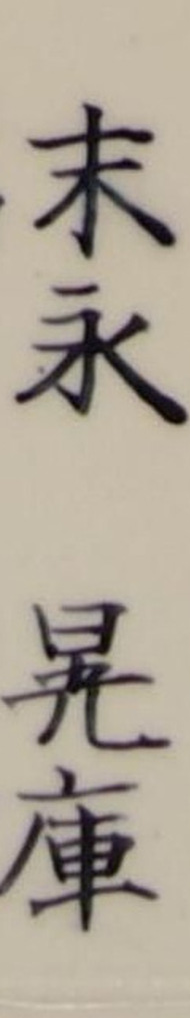末永晃庫
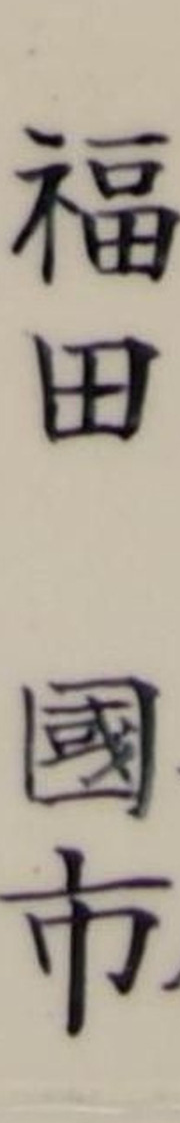福田國市
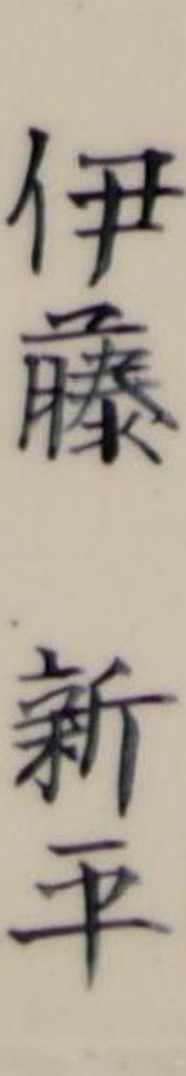伊藤新平
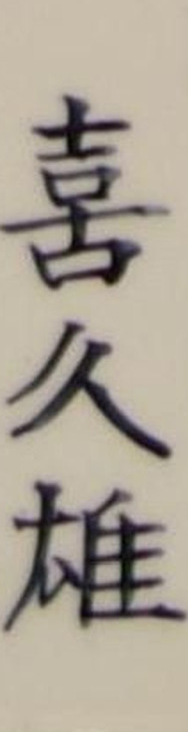喜久雄
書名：M~S
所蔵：高野山金剛峯寺
